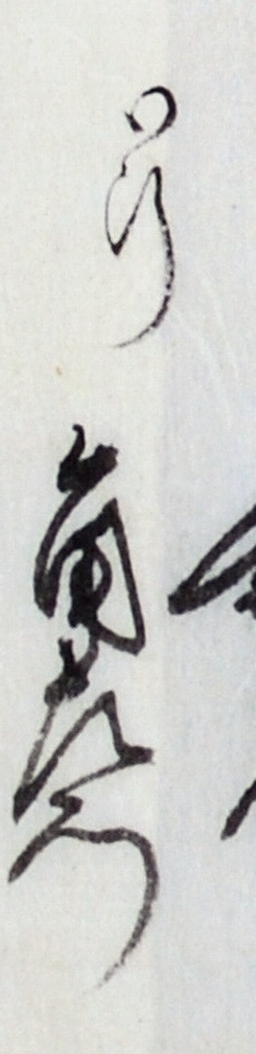同断角左衛門
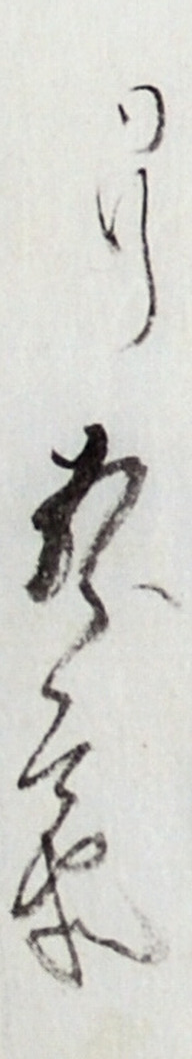同断五郎兵衛

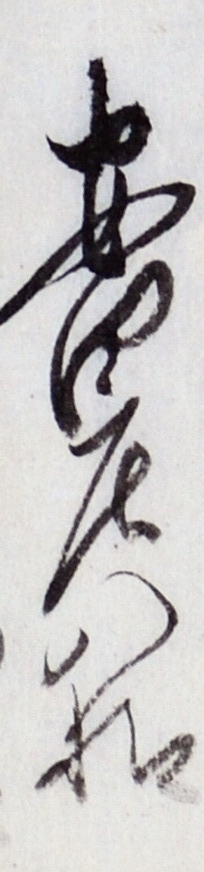安田庄八様
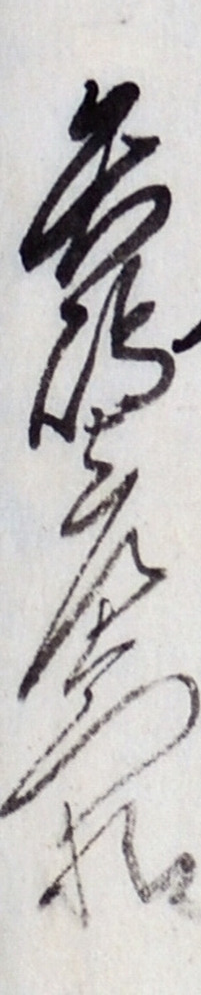矢嶋彦右衛門様
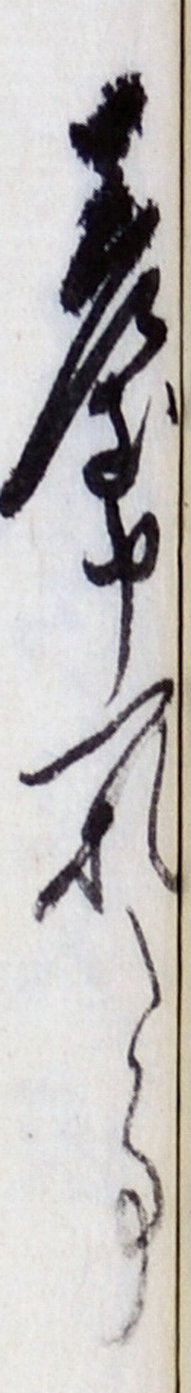差上申一札之事
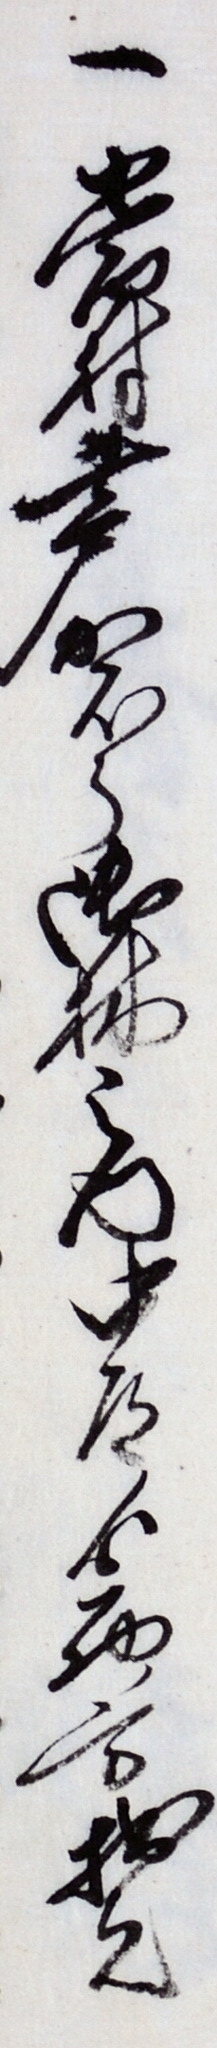一当村芦かほら御林之内中道ゟ西ノ方拙者
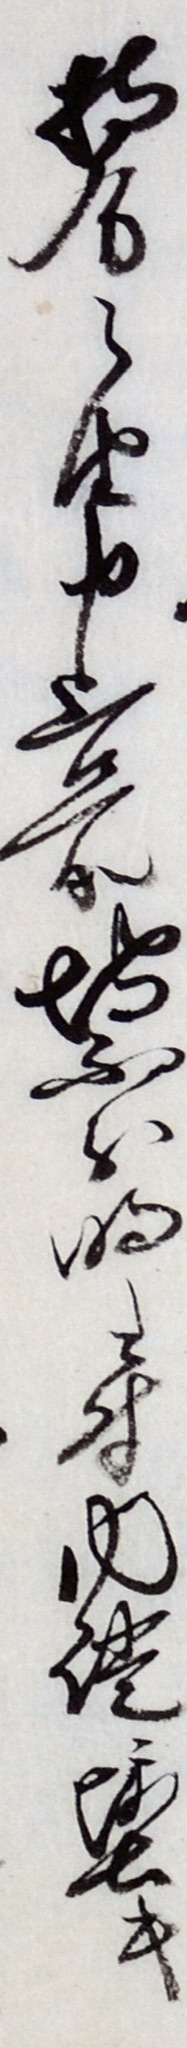持分之由申上候所埒不分明候ニ付内証ニ堅キ
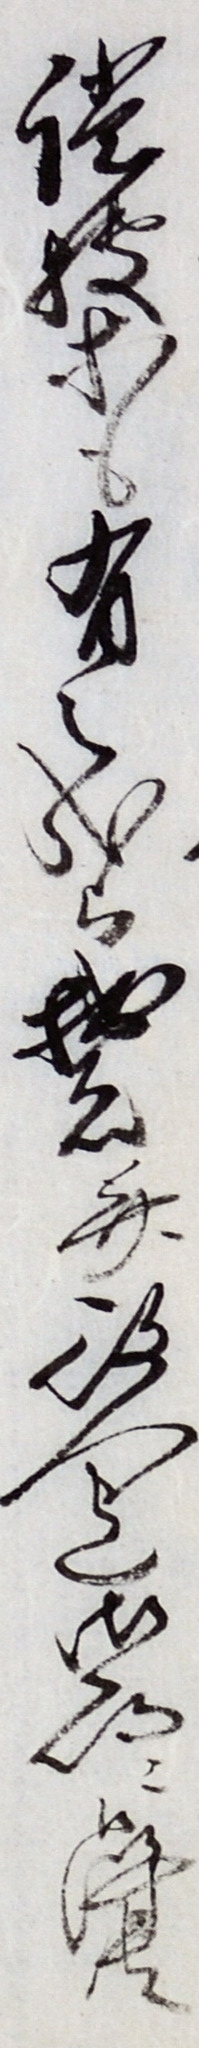証拠等も有之哉与拙者并役人迄御尋ニ候得共
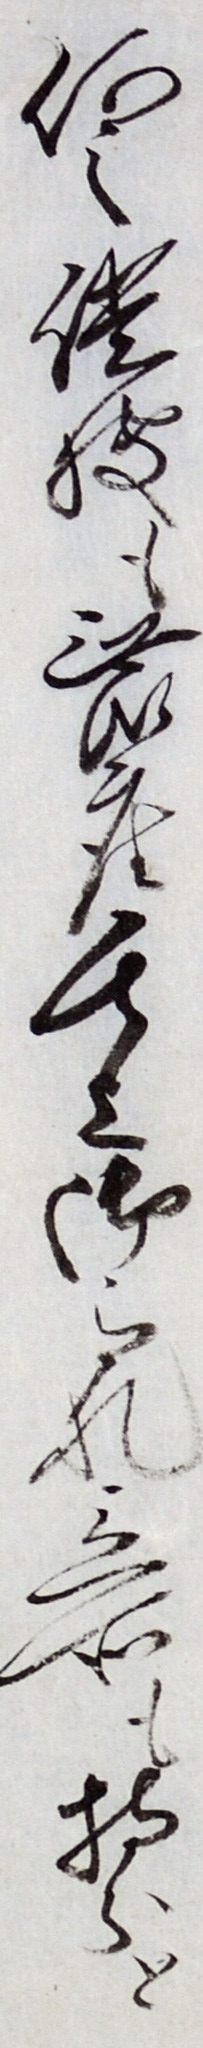何之証拠も無御座其上御高札立所も持分と
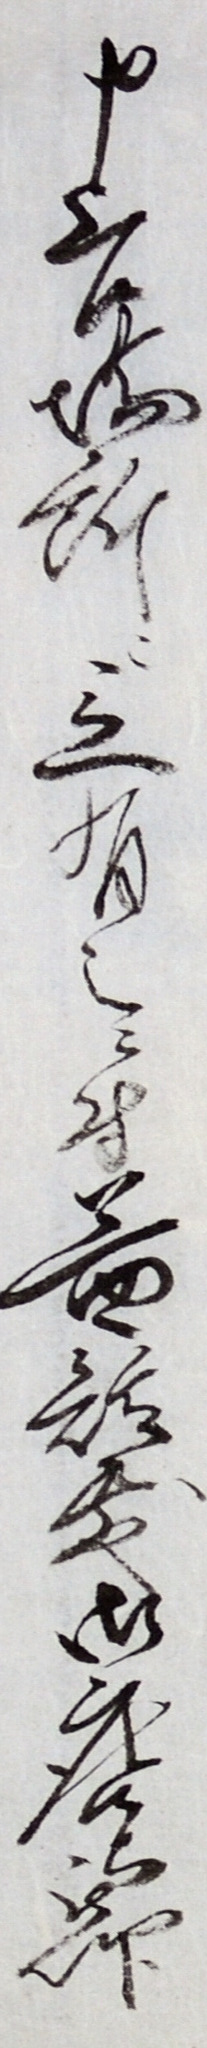申上候場所ニ立有之ニ付益疑敷御座候与被仰
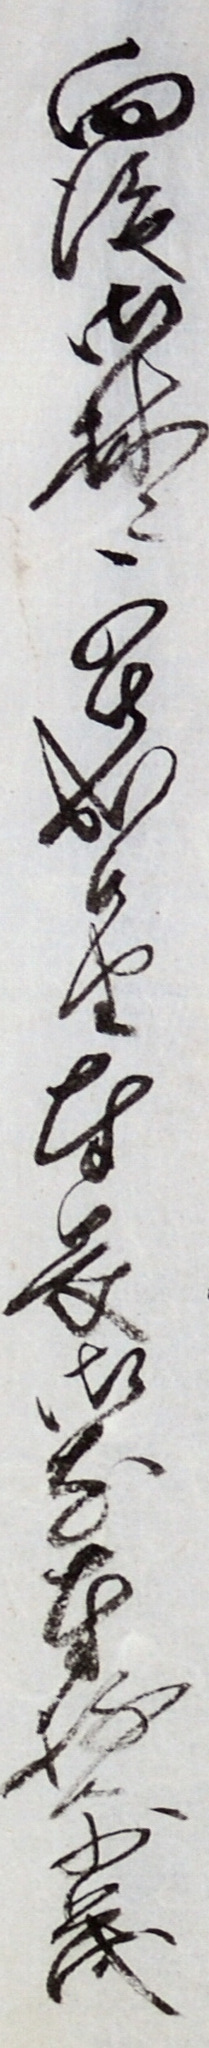向後御林ニ可被成候由奉畏御尤奉存候少も
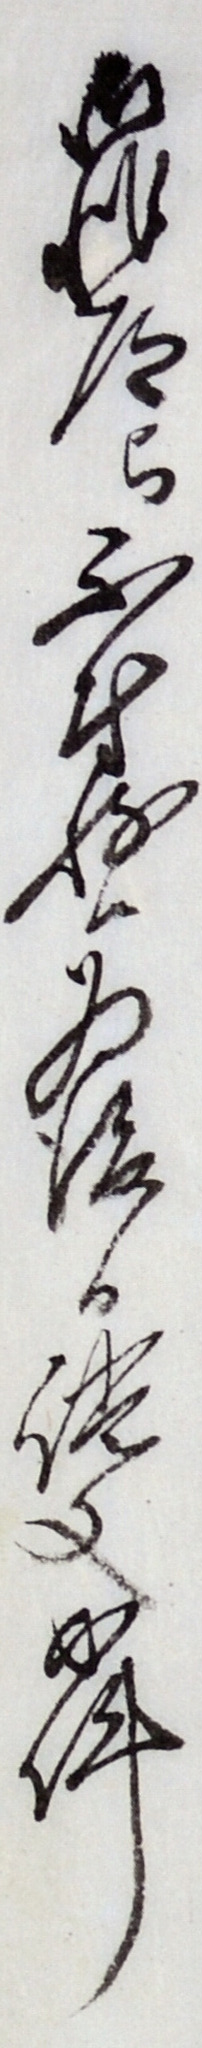御非道与不奉存候為後日証文如件

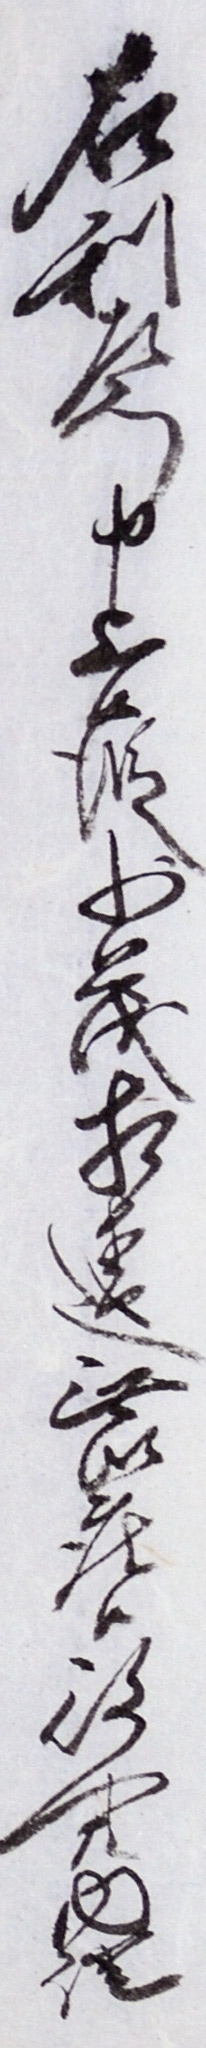右利左衛門申上候段少も相違無御座候役人共内証
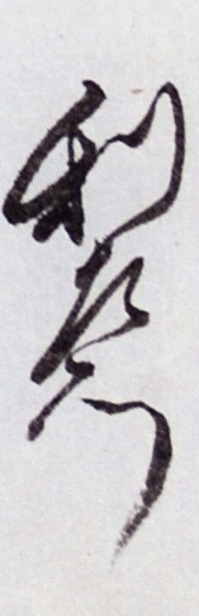利左衛門
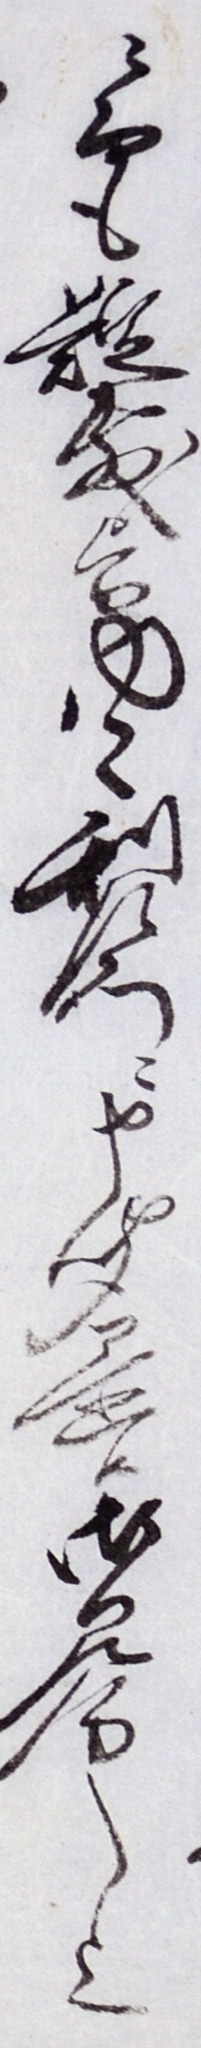ニ而も難敷旨内々利左衛門ニ申聞置候御見分之上
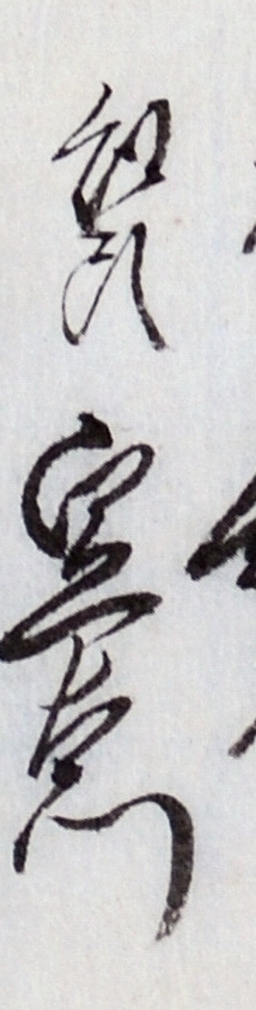組頭定右衛門
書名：御林御竹藪証文控
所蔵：伊那市立高遠町図書館・合同会社AMANE
